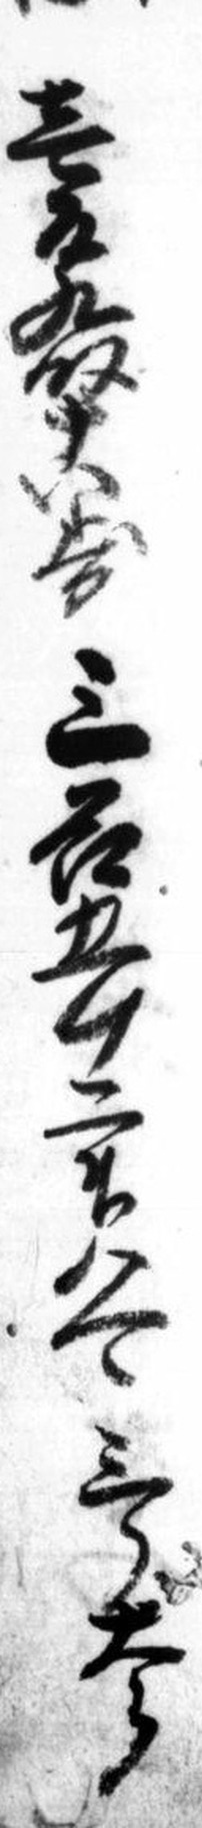上田壱反九畝十八歩三石五斗二升八合三郎太郎

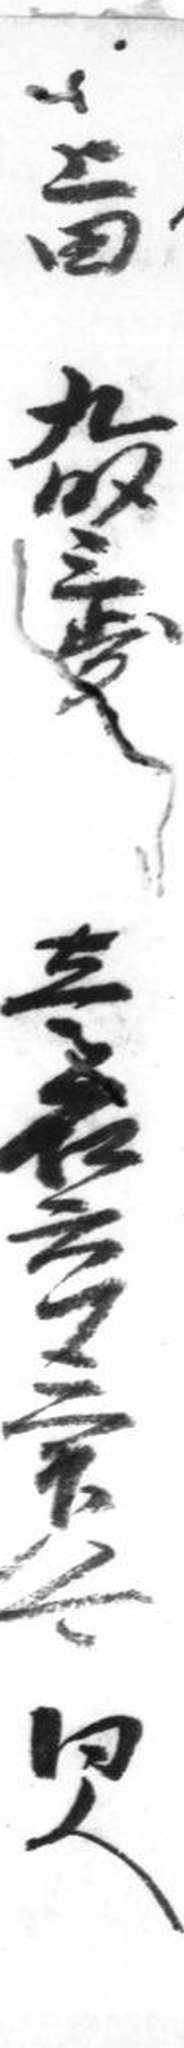上田九畝三歩壱石六斗三升八合同人
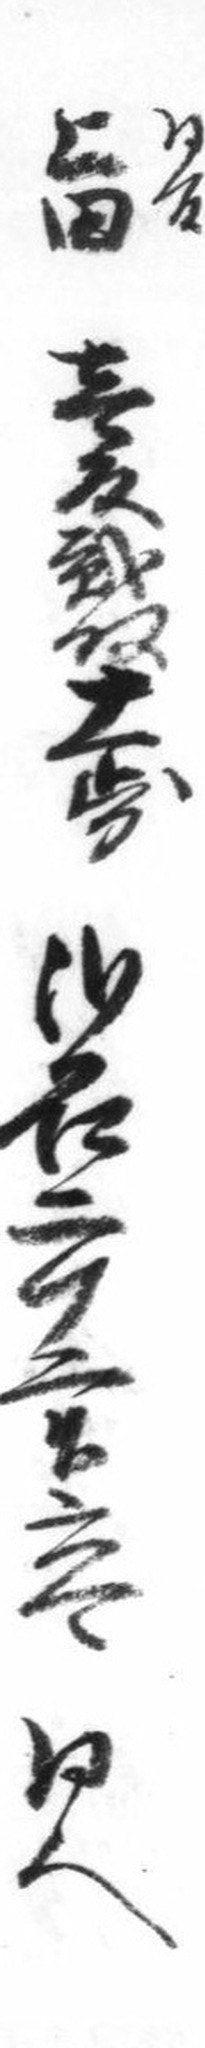上田壱反弐畝十一歩弐石二斗二升六合同人
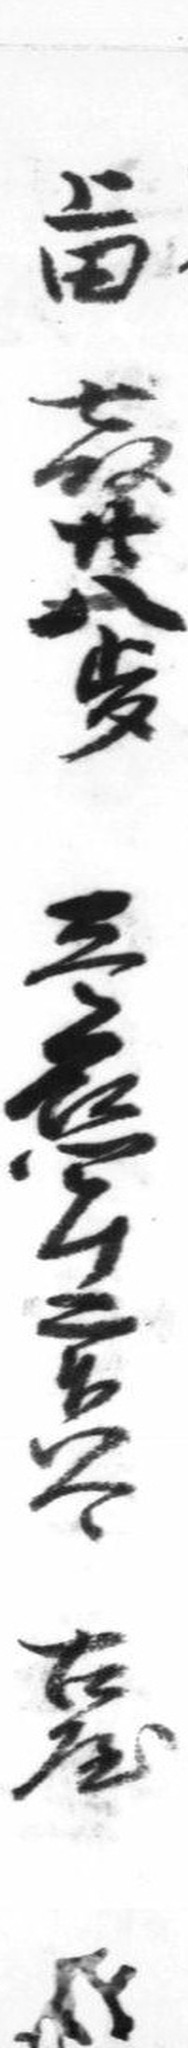上田七畝廿八歩壱石四斗二升八合古屋
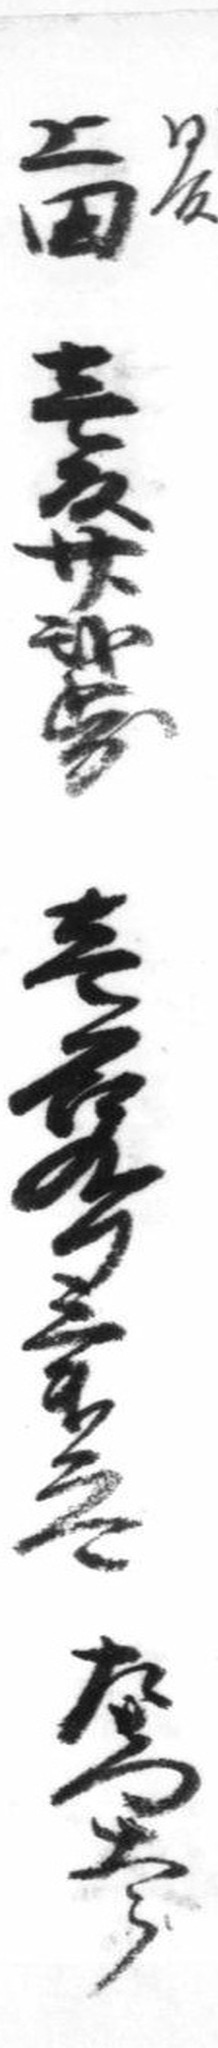上田壱反廿弐歩壱石九斗三升二合左衛門太郎
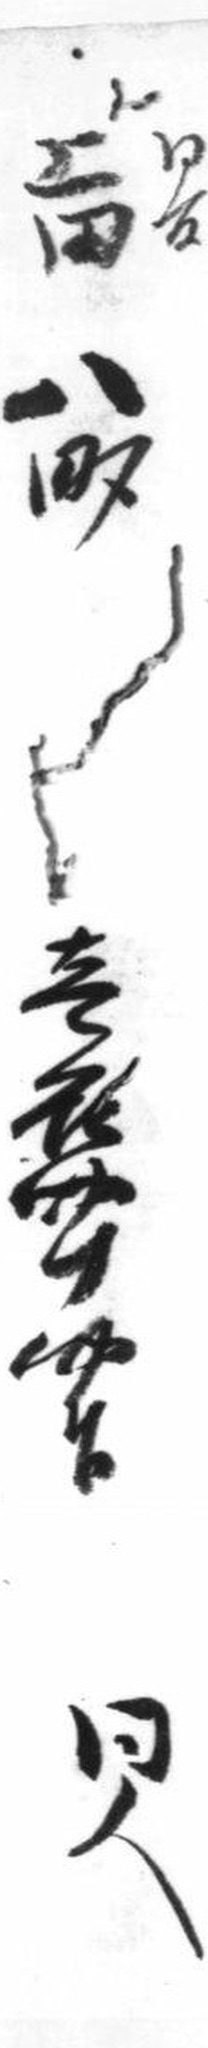上田八畝壱石四斗四升同人
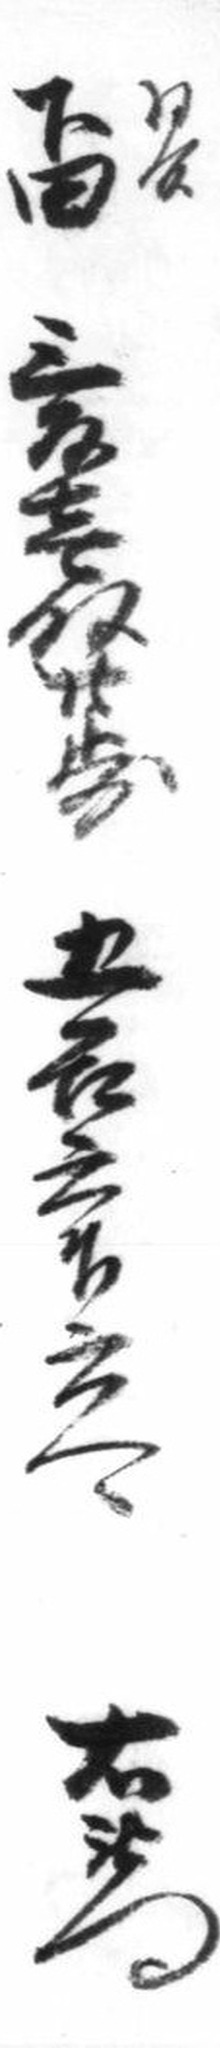下田三反壱畝廿歩五石六升六合右衛門
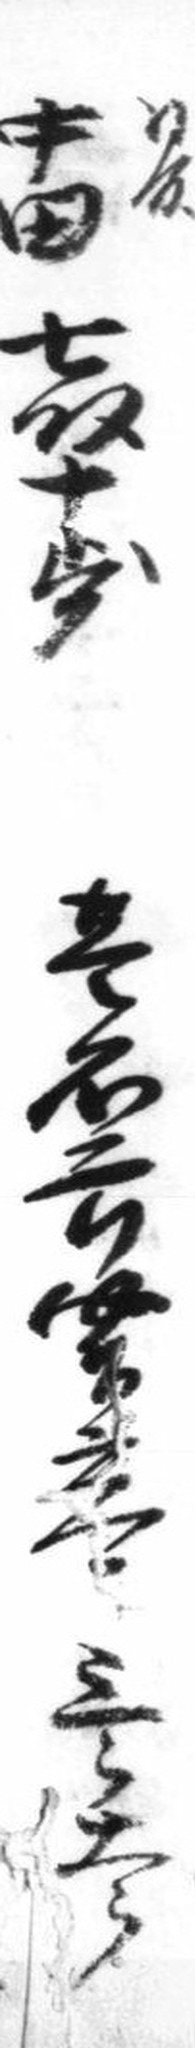中田七畝十歩壱石二斗四升六合三郎太郎
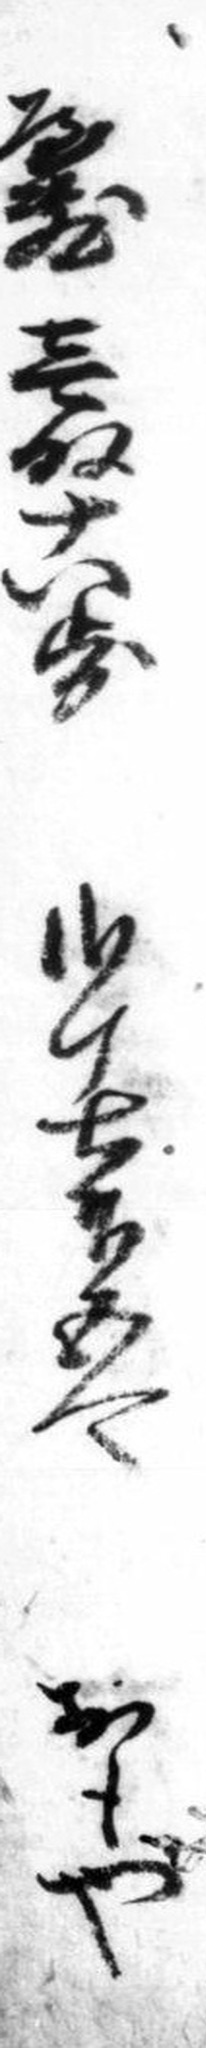屋敷壱畝十八歩弐斗七升五合出〆や

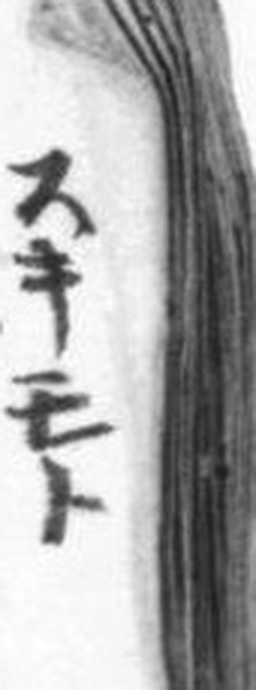スキモト
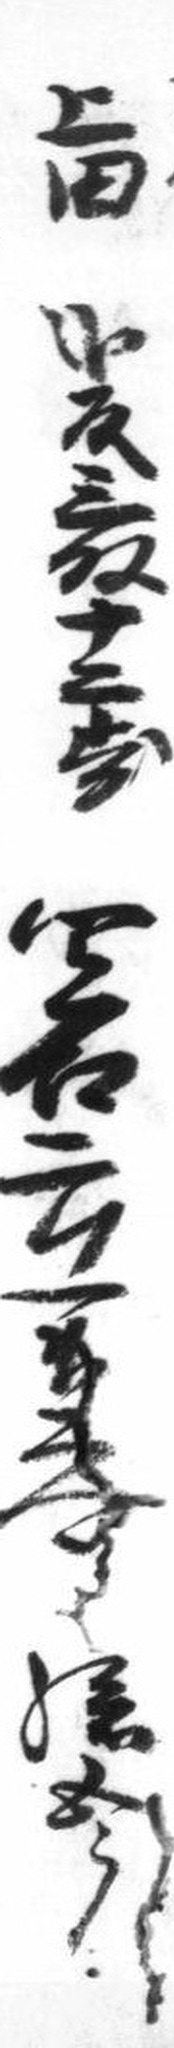上田弐反三畝十二歩四石二斗一升二合孫五郎
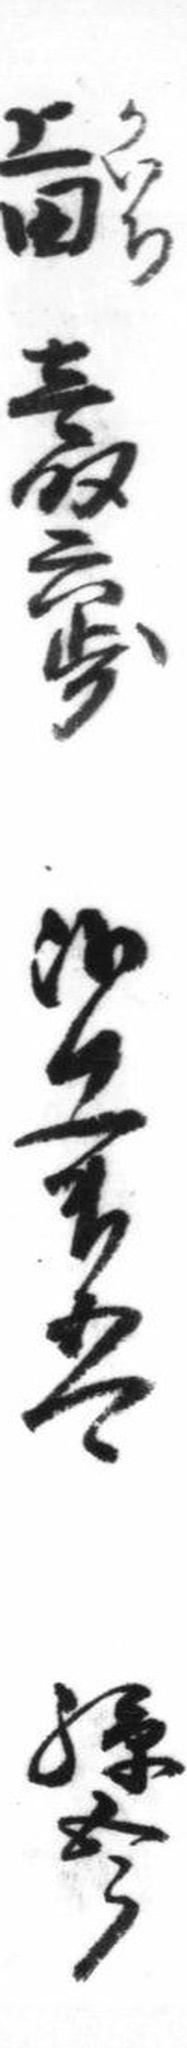上田壱畝六歩弐斗一升五合孫五郎
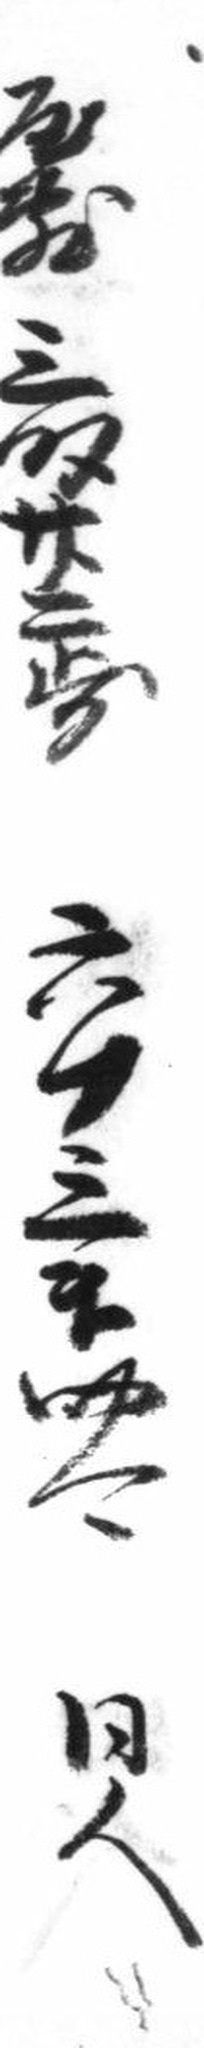屋敷三畝廿三歩六斗三升四合同人
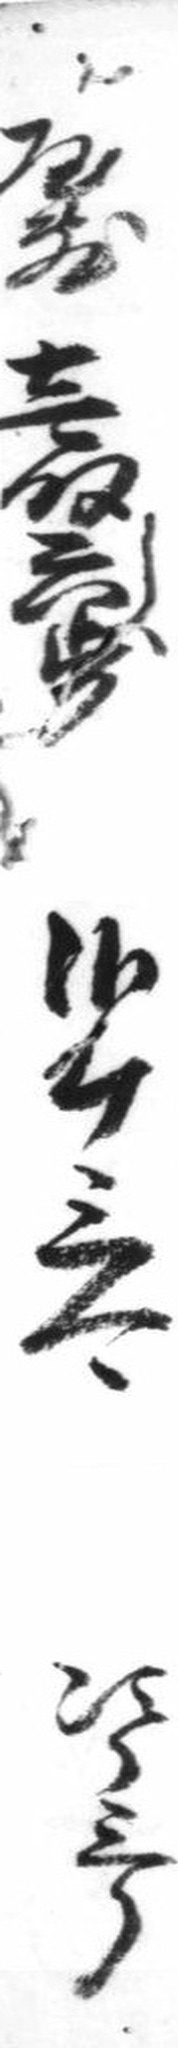屋敷壱畝六歩弐斗三合次郎三郎
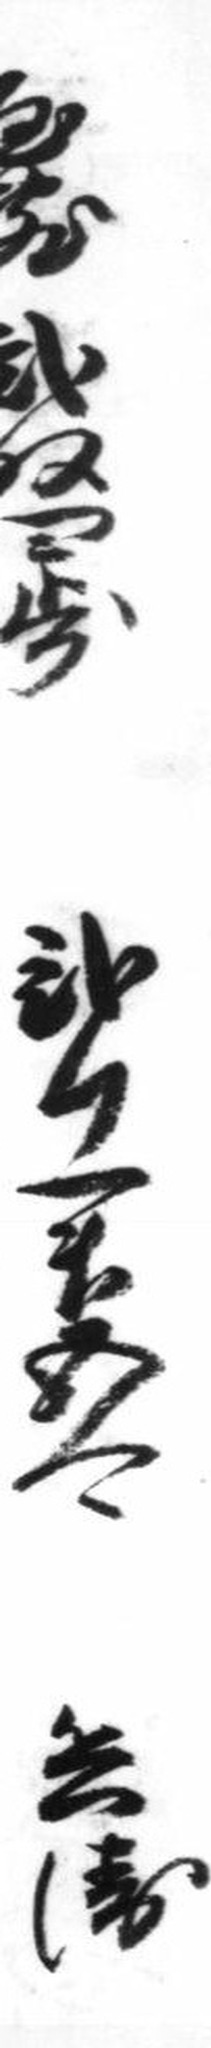屋敷弐畝四歩弐斗一升五合兵衛

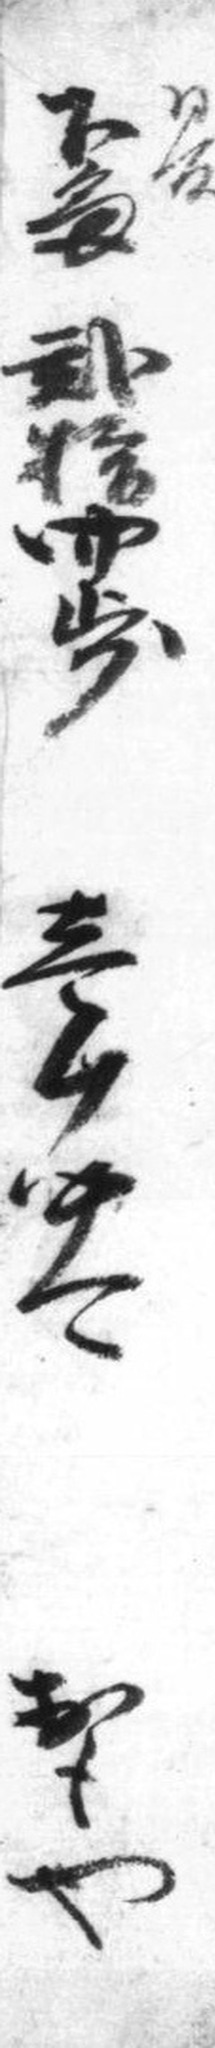下畠弐拾四歩壱斗四合出〆や
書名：越前国大野郡今井村御検地帳
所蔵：福井県文書館 Fukui Prefectural Archives
